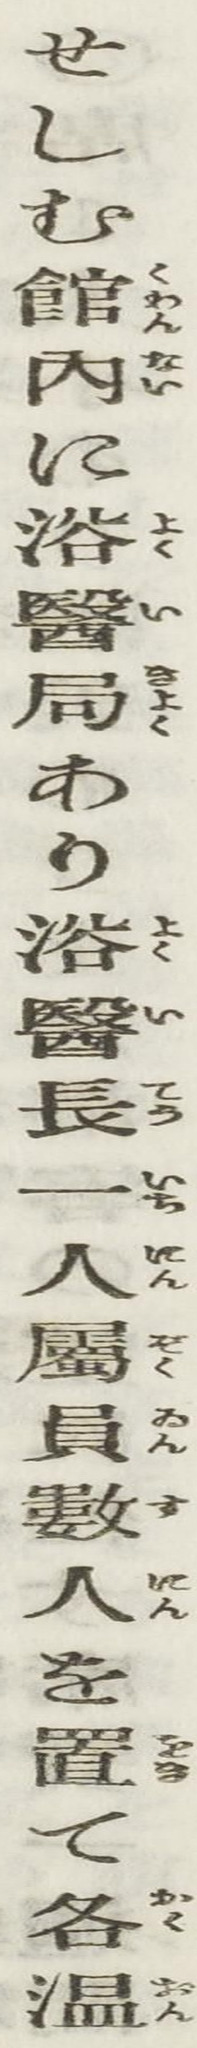せしむ館内に浴醫局あり浴醫長一人属員数人を置て各温
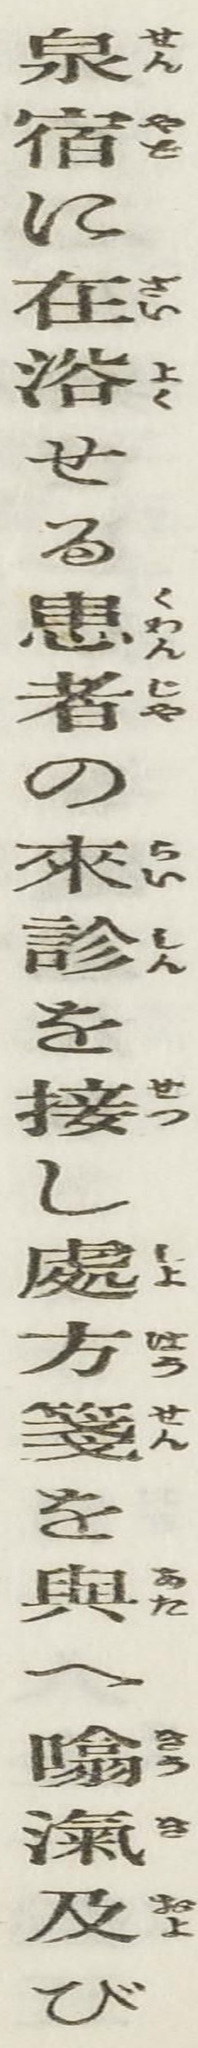泉宿に在浴せる患者の来診を接し處方箋を與へ噏滊及び
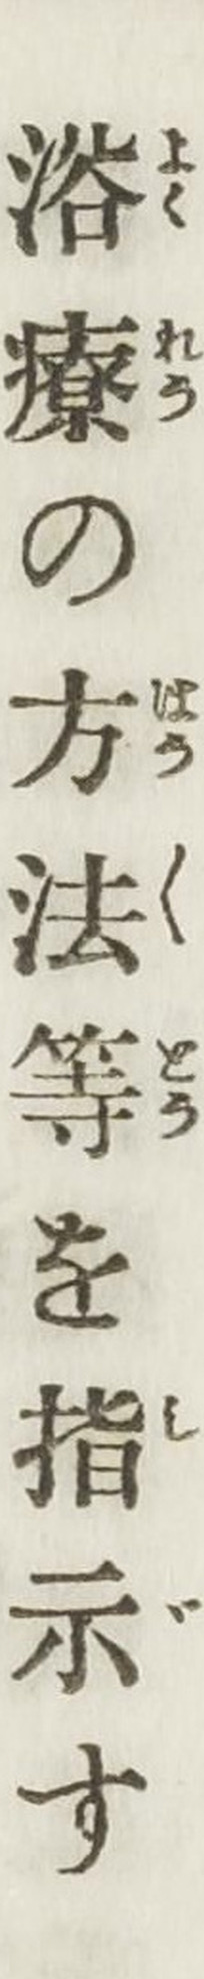浴療の方法等を指示す
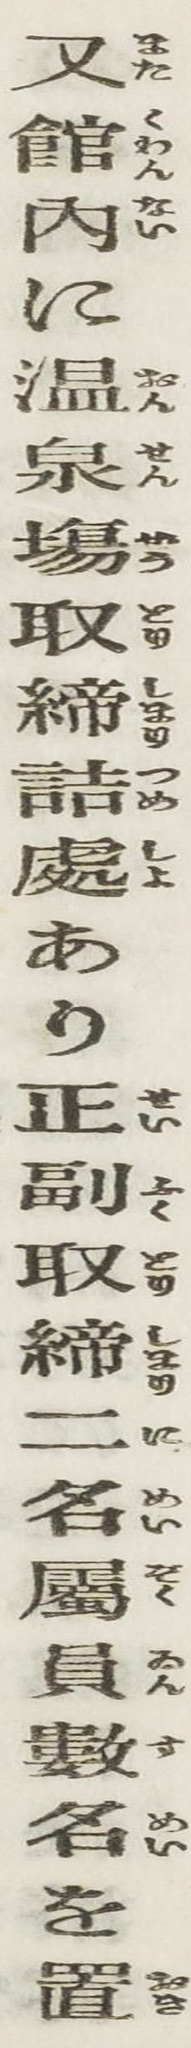又館内に温泉場取締詰處あり正副取締二名属員数名を置
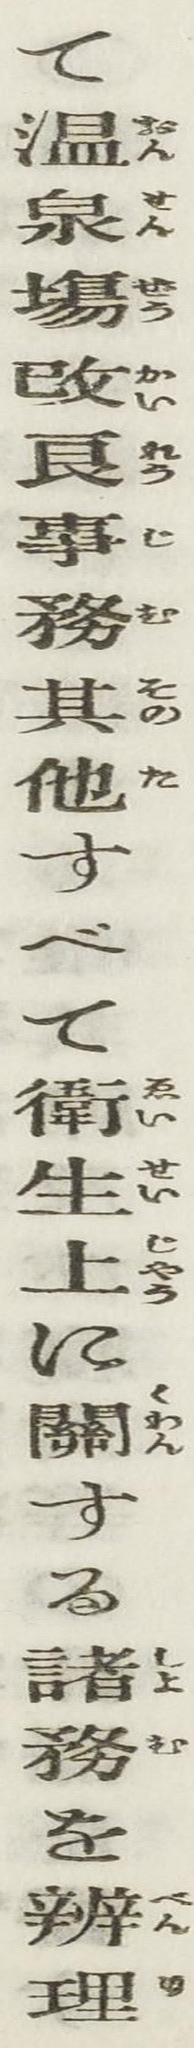て温泉場改良事務其他すべて衛生上に関する諸務を辨理
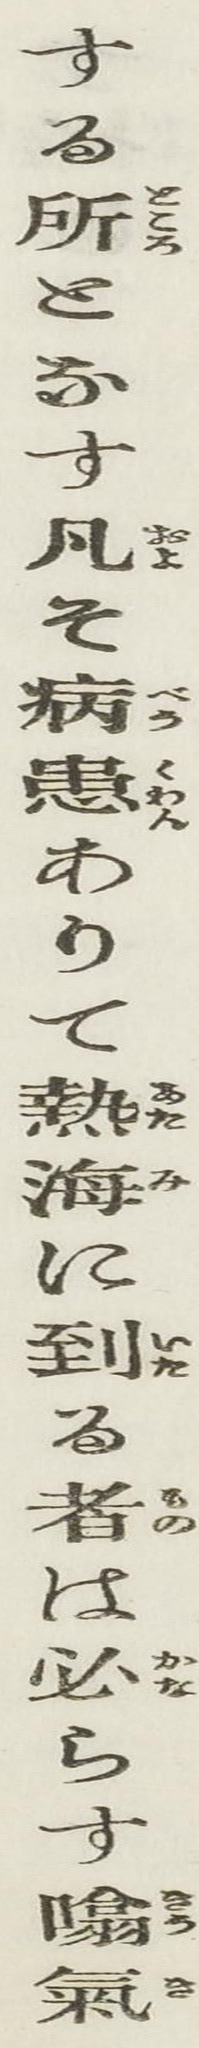する所となす凡そ病患ありて熱海に到る者は必らす噏氣
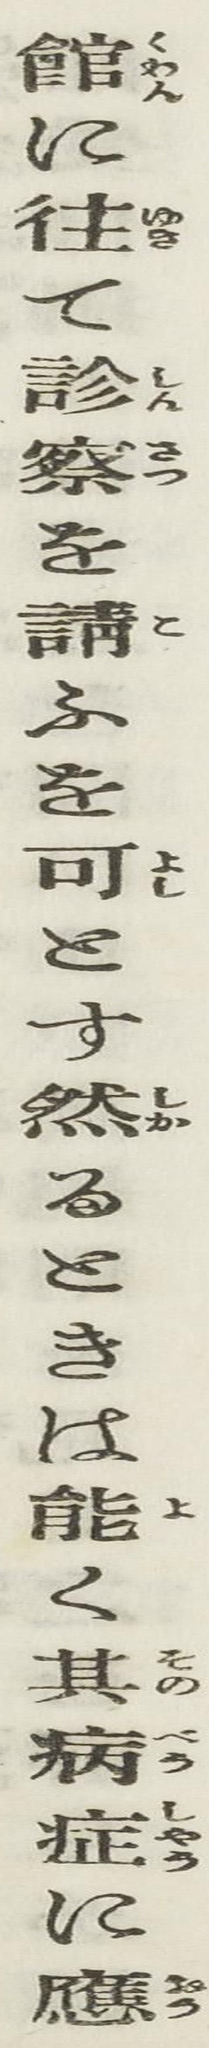館に往て診察を請ふを可とす然るときは能く其病症に応
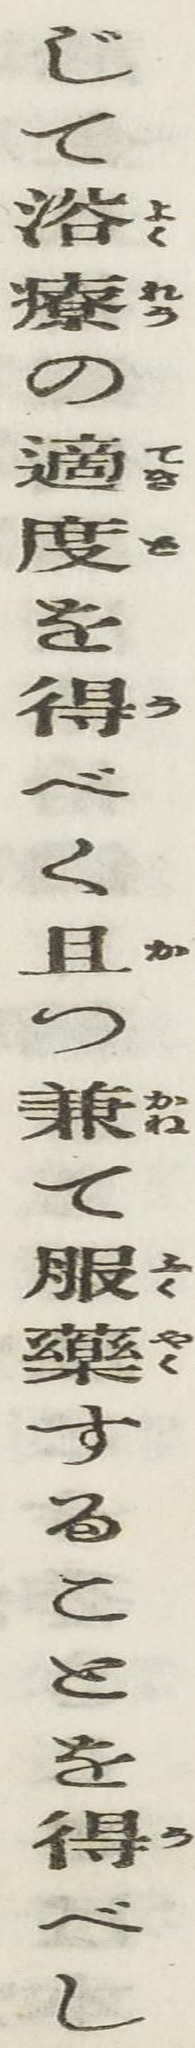じて浴療の適度を得べく且つ兼て服薬することを得べし
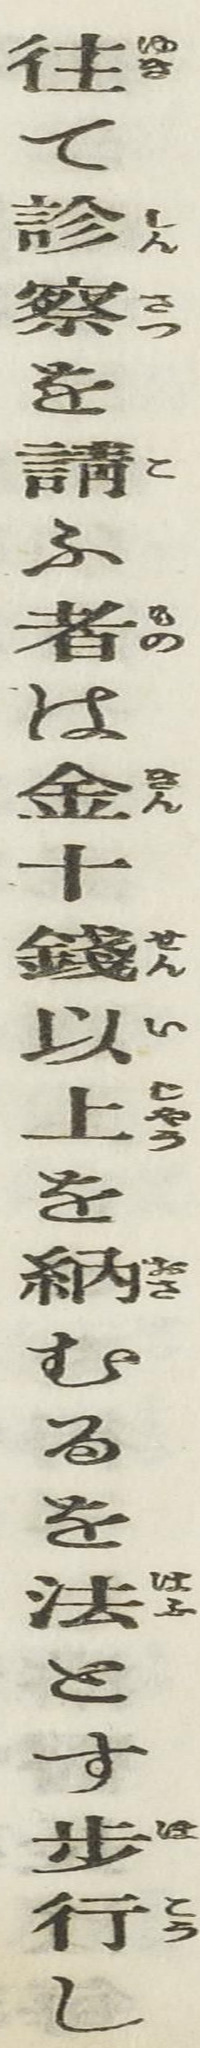往て診察を請ふ者は金十銭以上を納むるを法とす歩行し

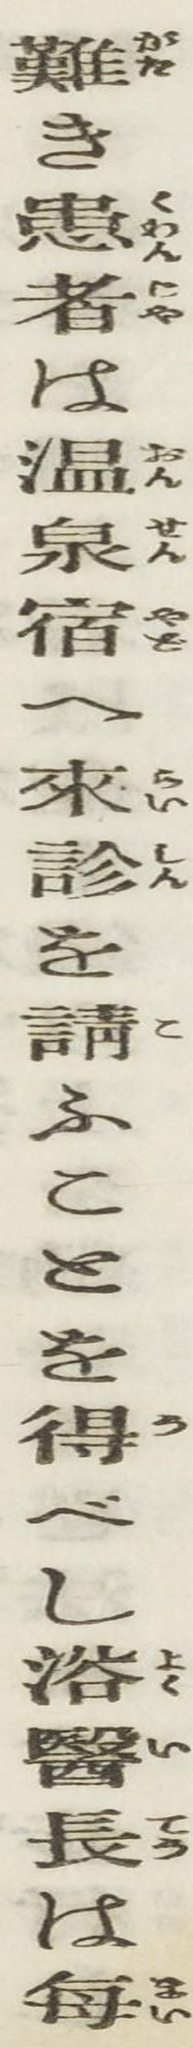難き患者は温泉宿へ来診を請ふことを得べし浴醫長は毎
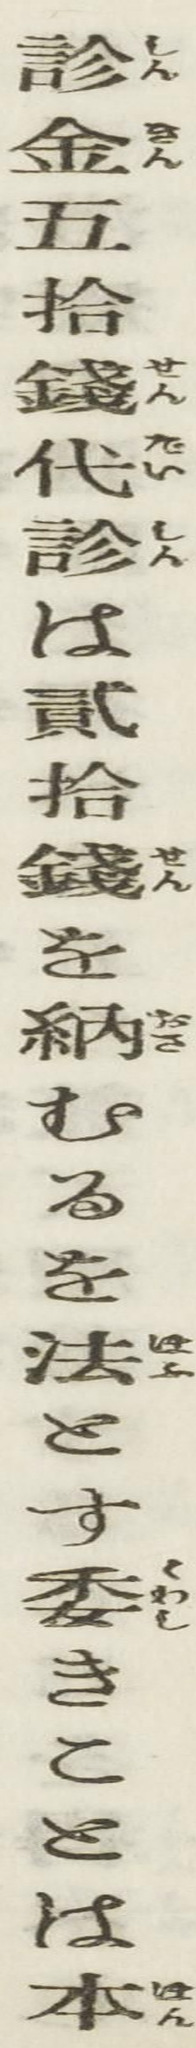診金五拾銭代診は貮拾銭を納むるを法とす委きことは本
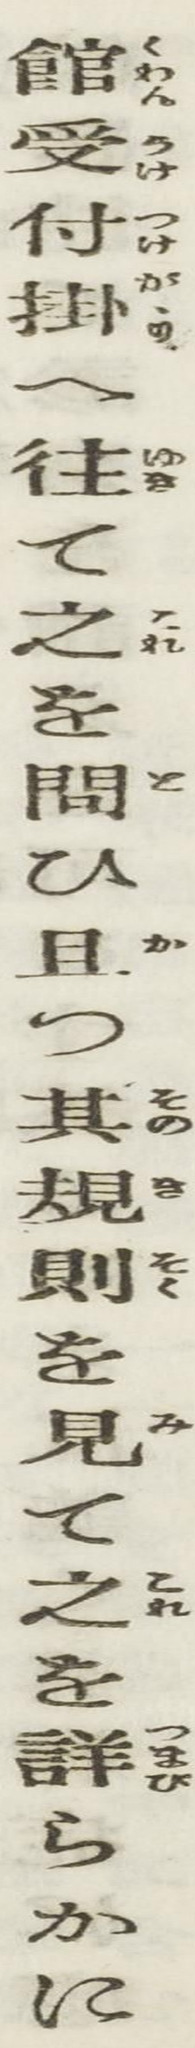館受付掛へ往て之を問ひ且つ其規則を見て之を詳らかに
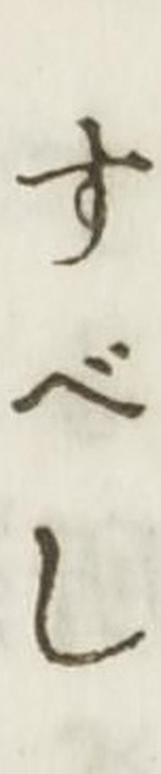すべし
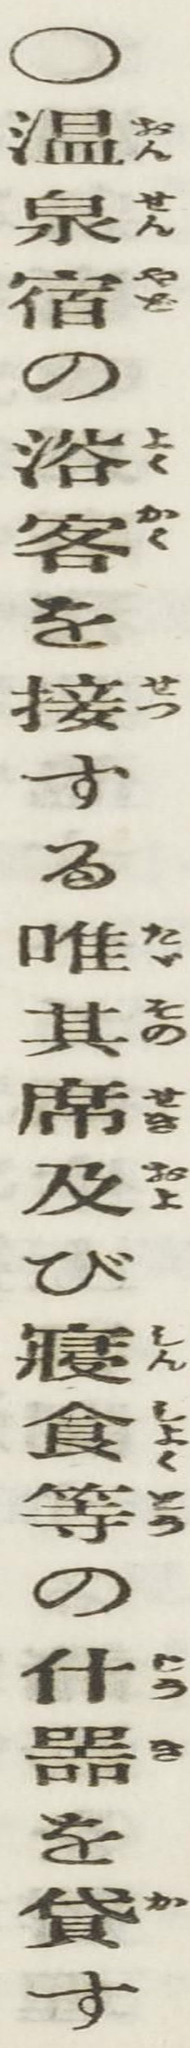○温泉宿の浴客を接する唯其席及び寝食等の什器を貸す
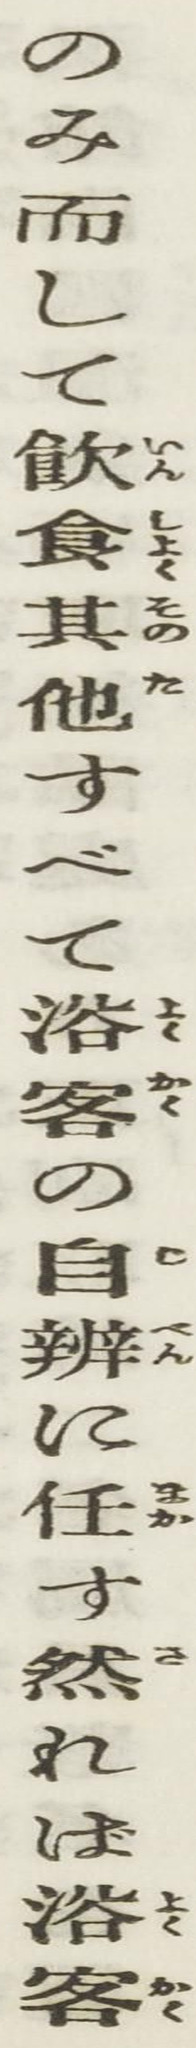のみ而して飲食其他すべて浴客の自辨に任す然れば浴客
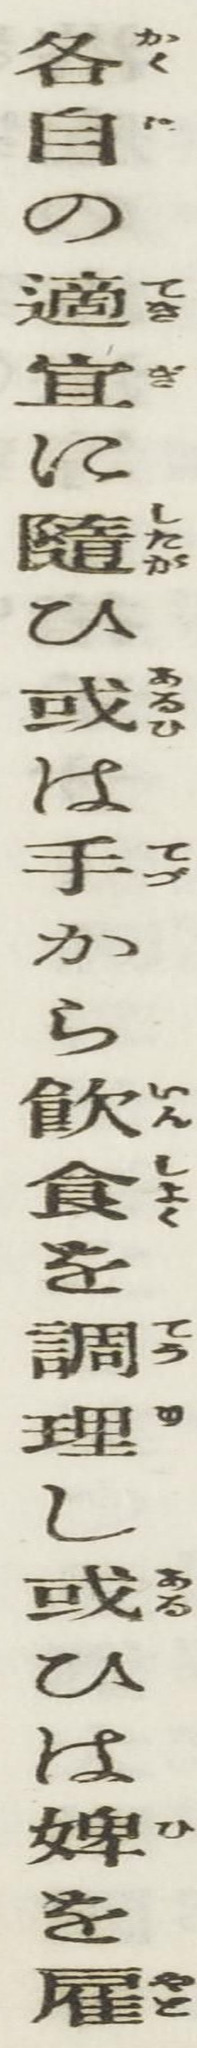各自の適宜に随ひ或は手から飲食を調理し或ひは婢を雇
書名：熱海獨案内　全
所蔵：東京大学地震研究所図書室 Earthquake Research Institute Library, The University of Tokyo, JAPAN
